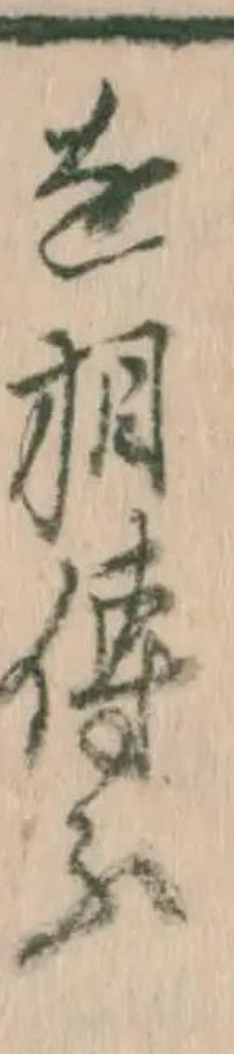を相伝ふ
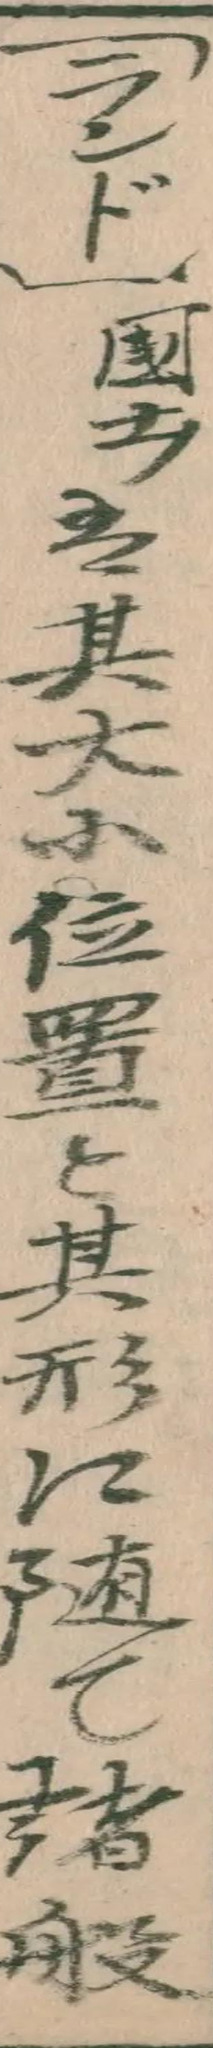(ランド)国土は其大小位置と其形に随て諸般

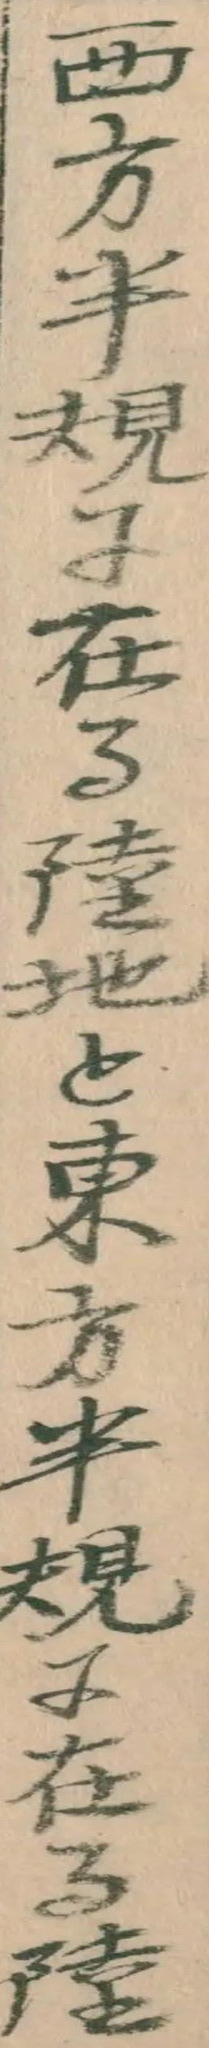西方半規に在る陸地と東方半規に在る陸
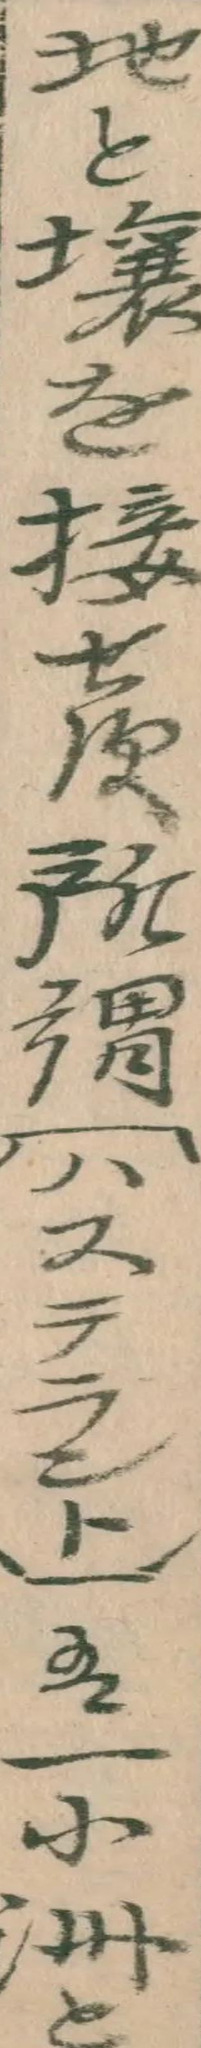地と壌を接せす所謂(ハステラント)は一小洲と
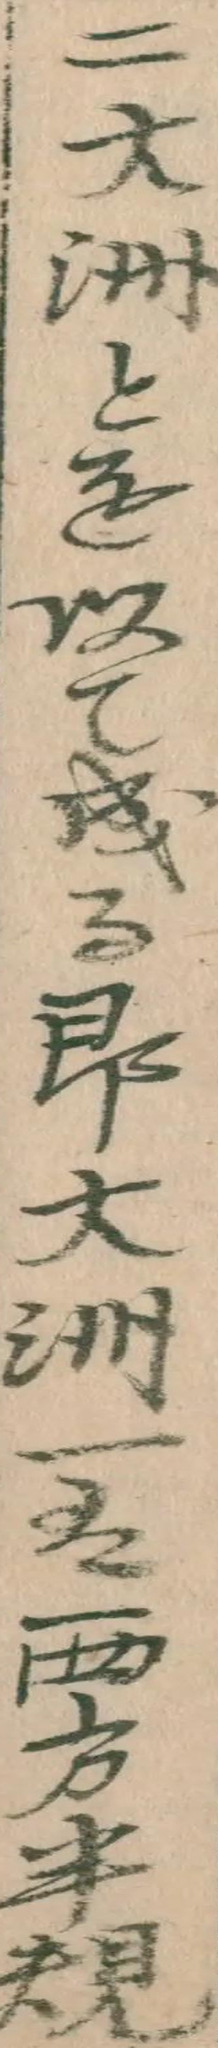二大洲とを以て或る即大州一は西方半規
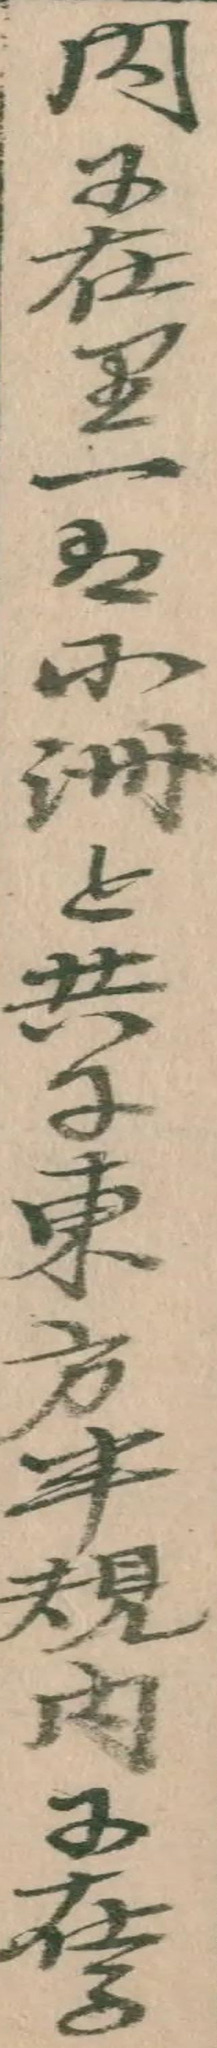内に在り一は小洲と共に東方半規内に在る
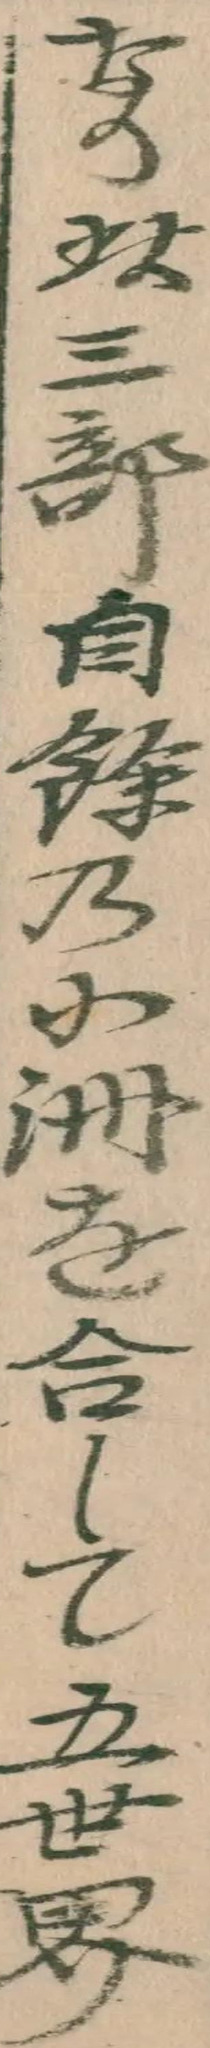なり此三部自余の小洲を合して五世界
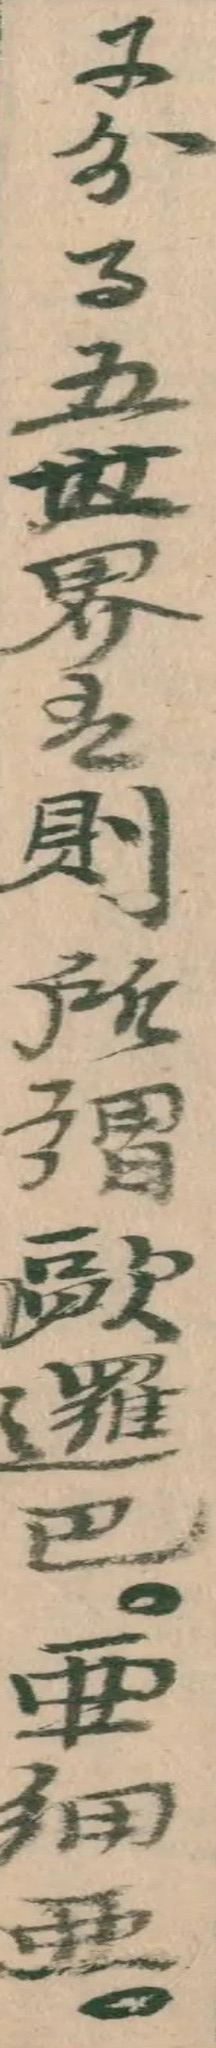に分る五世界は則所謂欧邏巴。亜細亜。
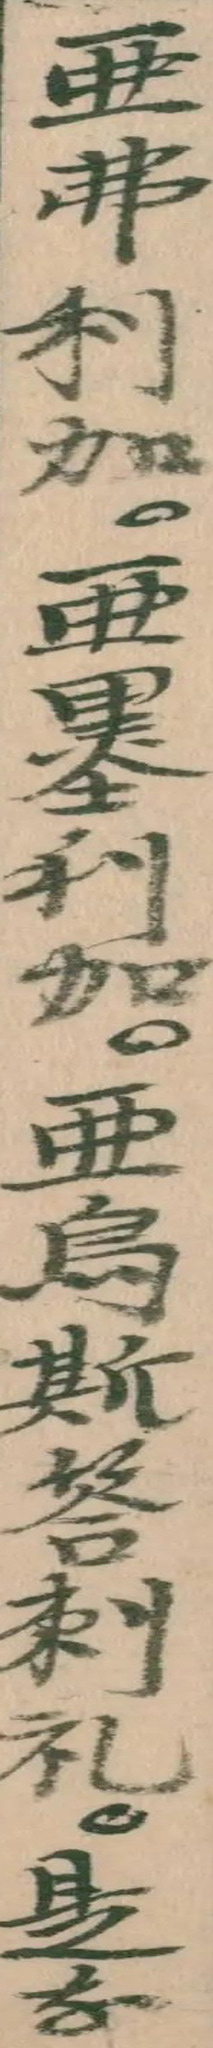亜弗利加。亜墨利加。亜烏斯答剌礼。是な
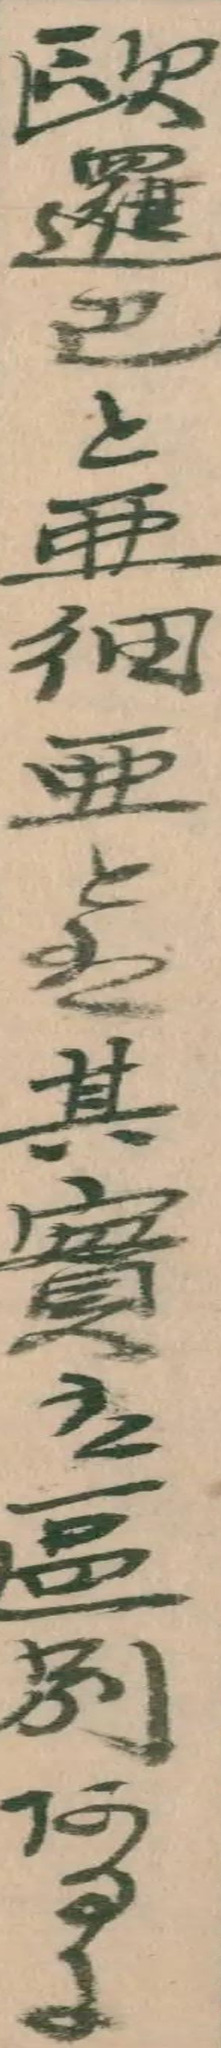欧邏巴と亜細亜とは其実は区別あるに
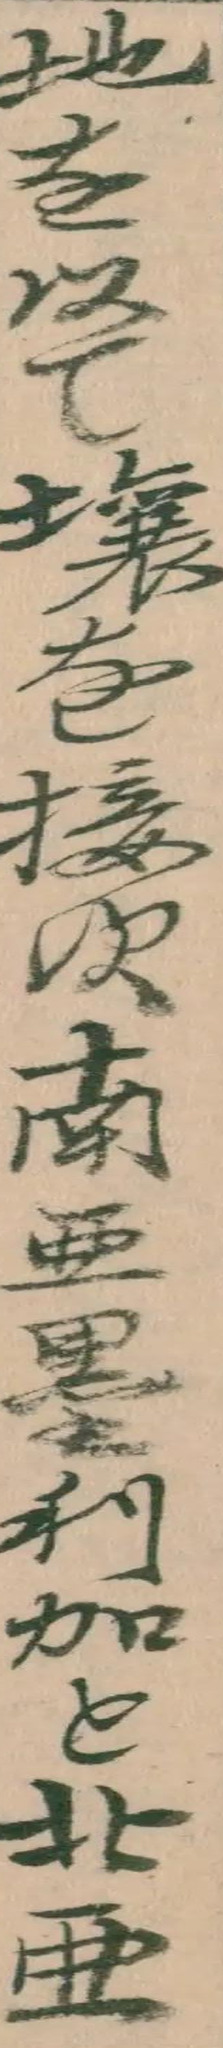地を以て壌を接す南亜墨利加と北亜
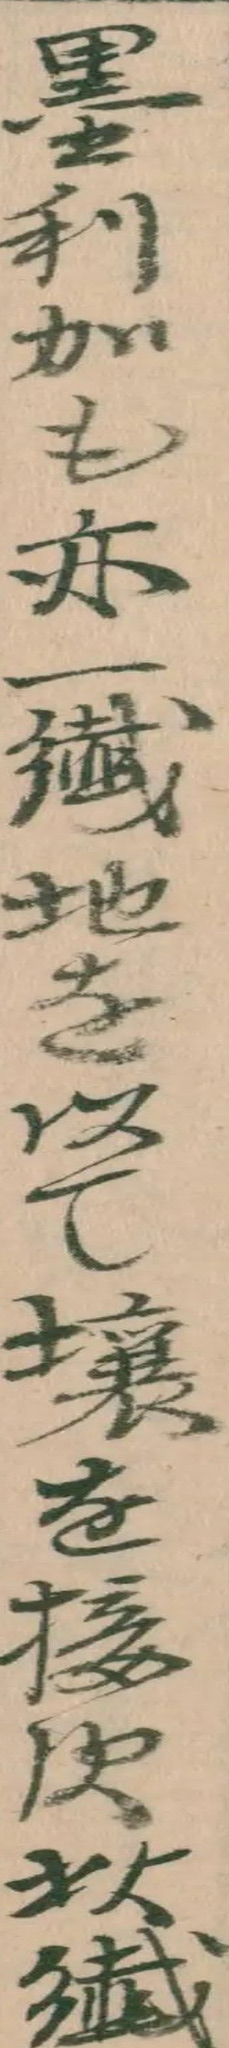墨利加も亦一繊地を以て壌を接す此繊
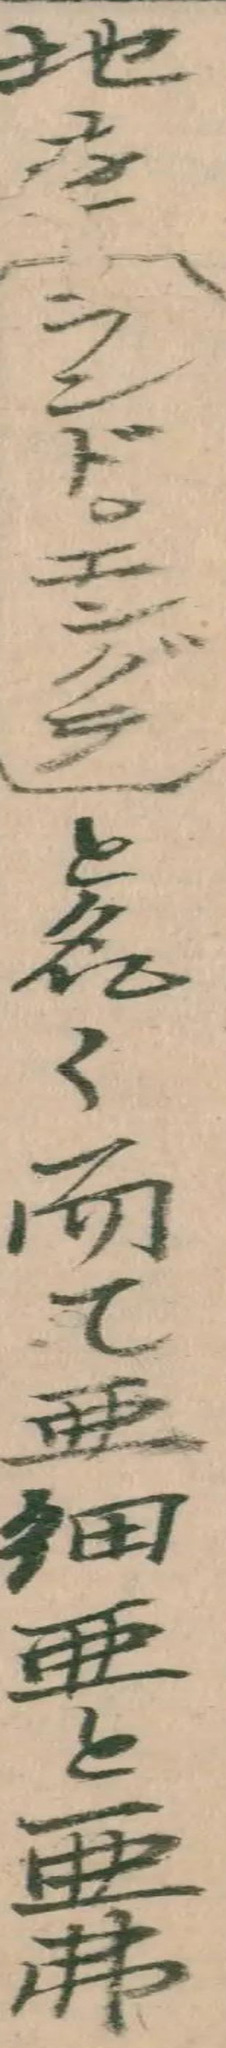地を(ランド・エングテ)と名く而て亜細亜と亜弗
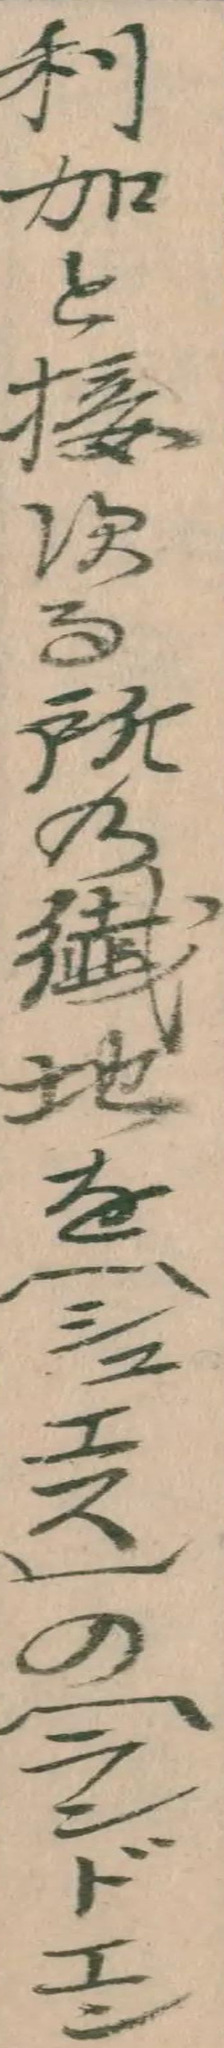利加と接する所の繊地を(シュエス)の(ランドエン
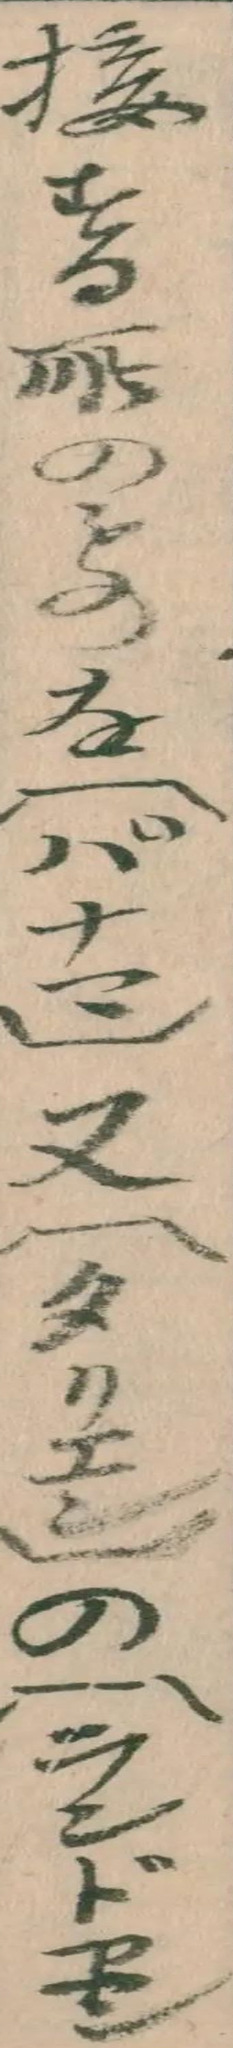接する所のものを(パナマ)又(タリエン)の(ランドヱン
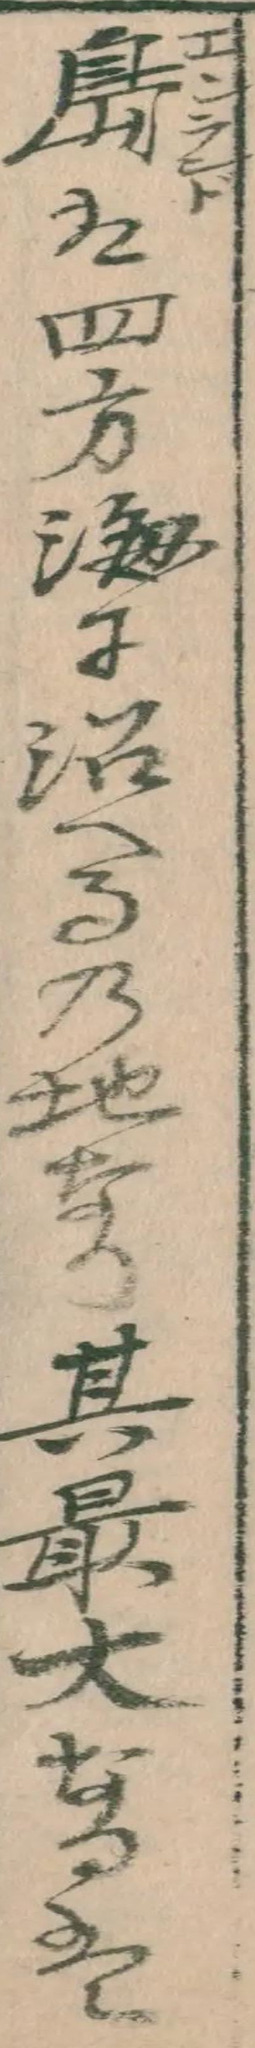島は四方海に沿へるの地なり其最大なるは
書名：新釈輿地図説
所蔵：国立国会図書館 National Diet Library, JAPAN
